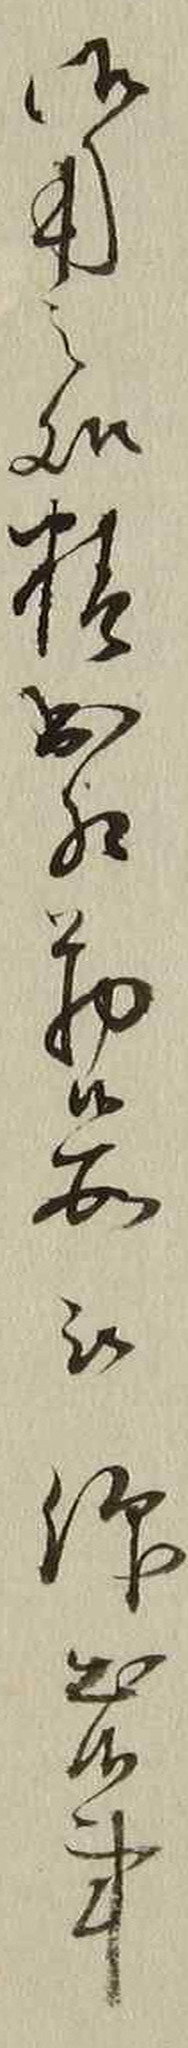御用之処精出相勤候段被仰出候事
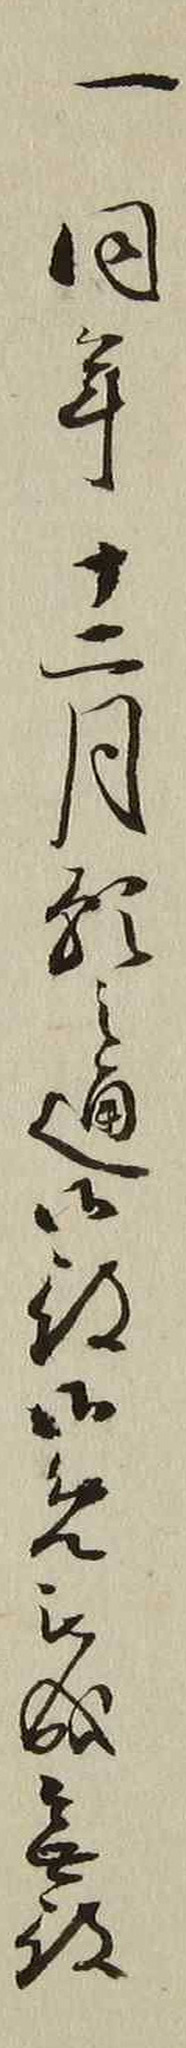一同年十二月願之通御役御免被成無役
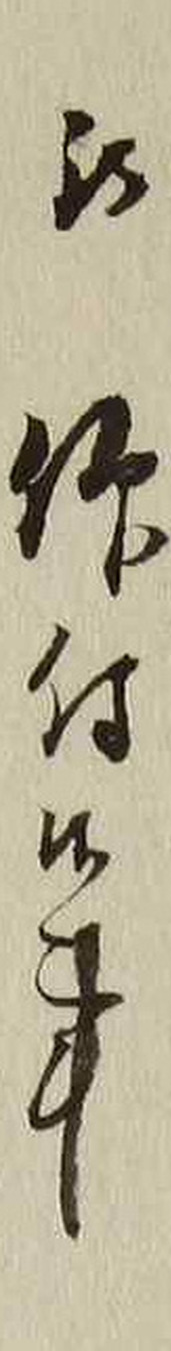被仰付候事
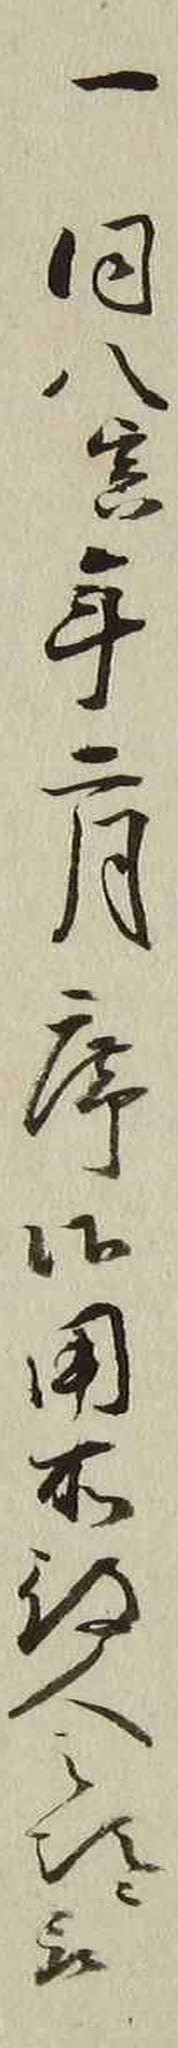一同八寅年二月席御用所役人之次ニ被
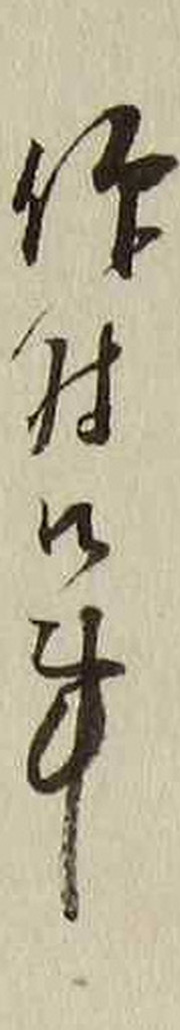仰付候事
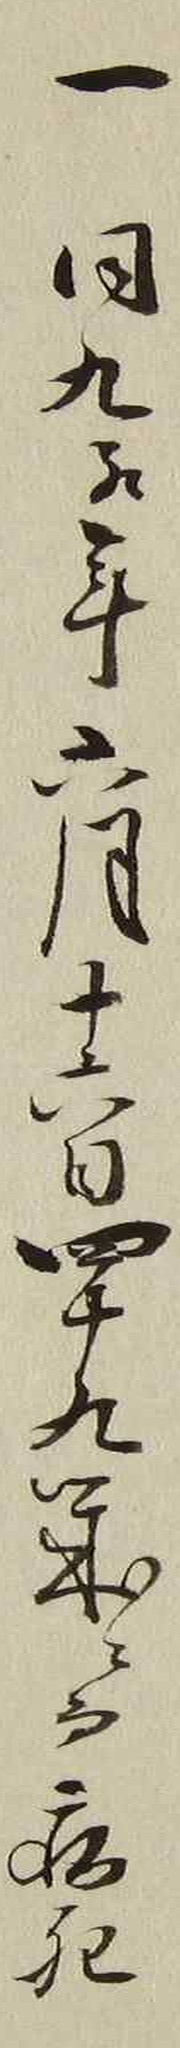一同九卯年六月十六日四十九歳ニ而病死
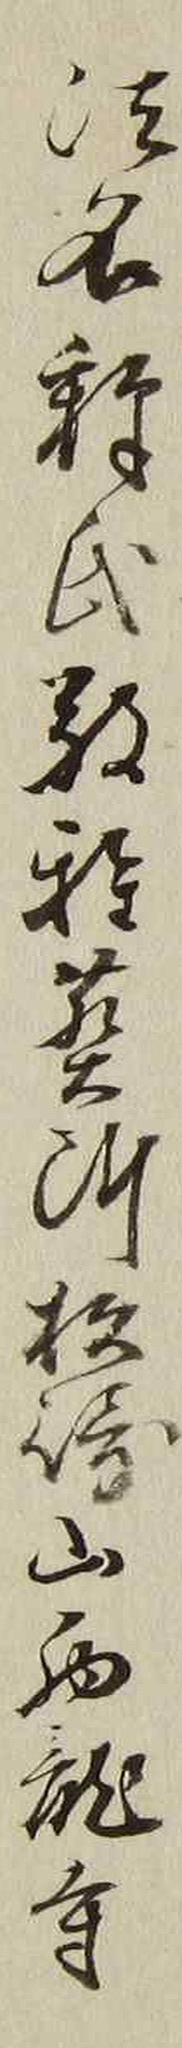法名釈氏敬雅葬所杉崎山西龍寺
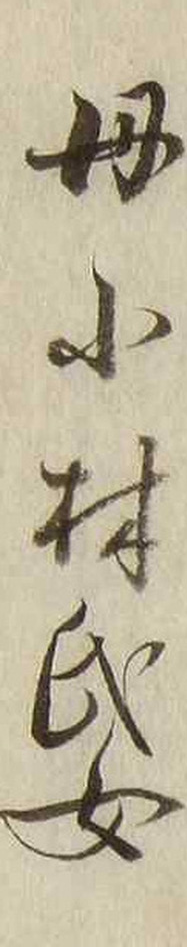母小村氏女

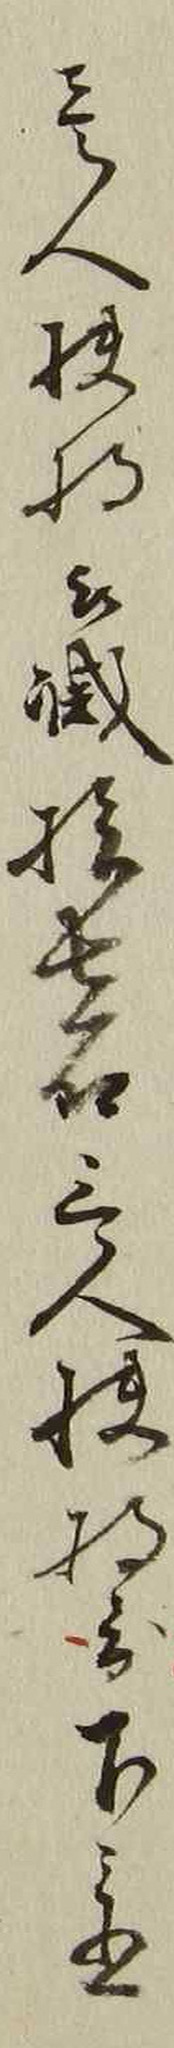壱人扶持被減拾七石三人扶持被下置
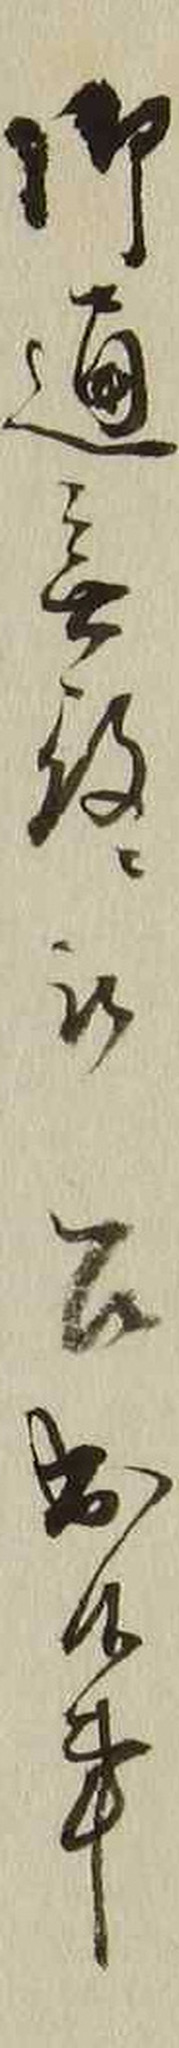御通無役ニ被召出候事
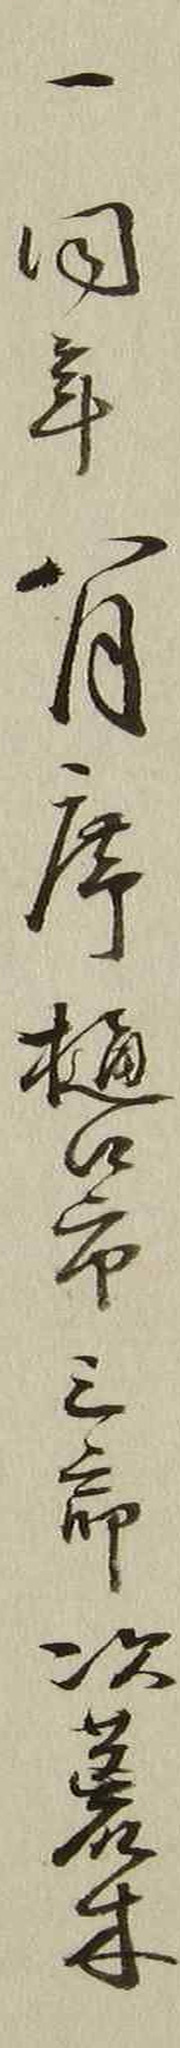一同年八月席樋口市三郎次荒木
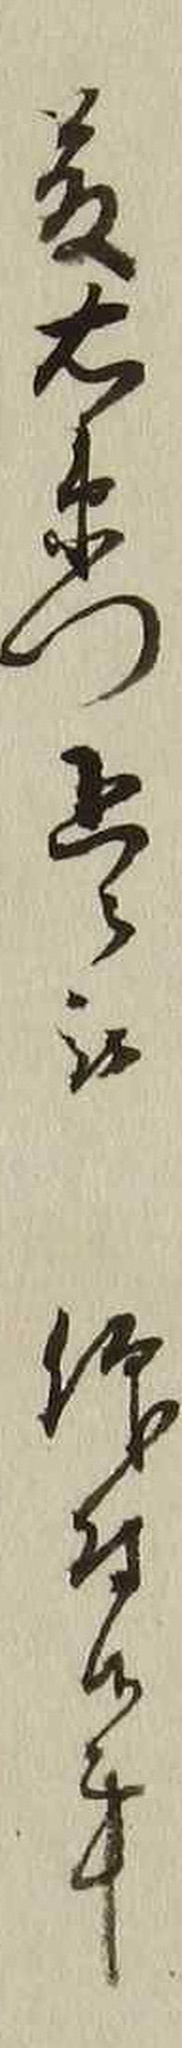藤右衛門上ニ被仰付候事
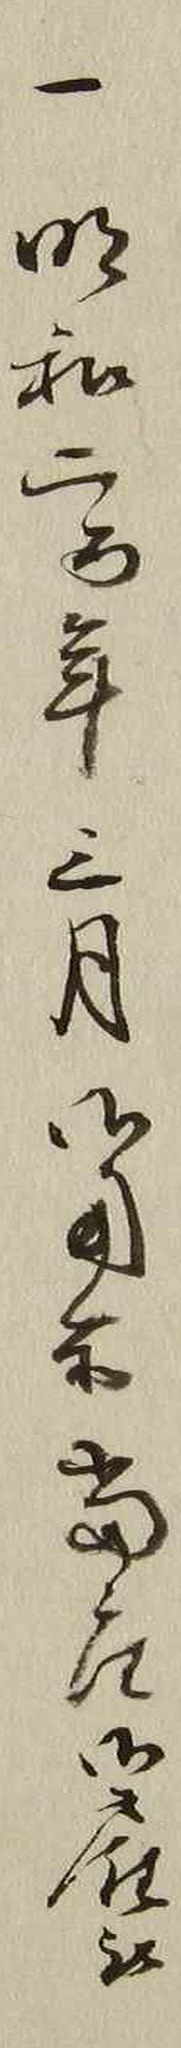一明和二酉年三月御用所当座御雇被
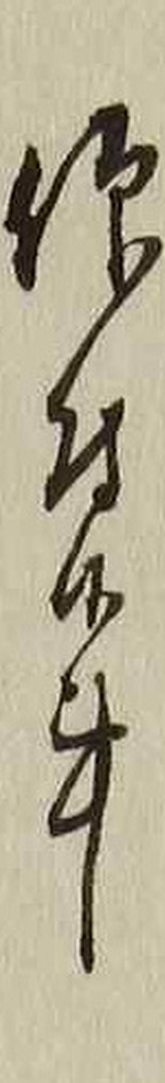仰付候事
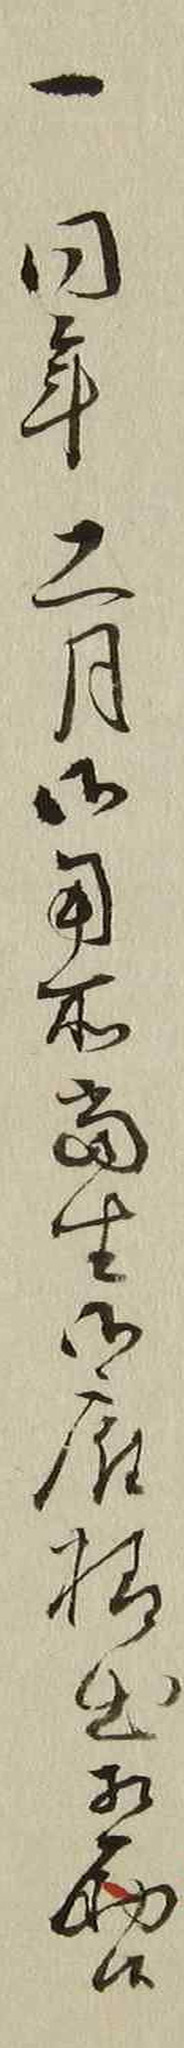一同年十一月御用所当座御雇精出相勤候
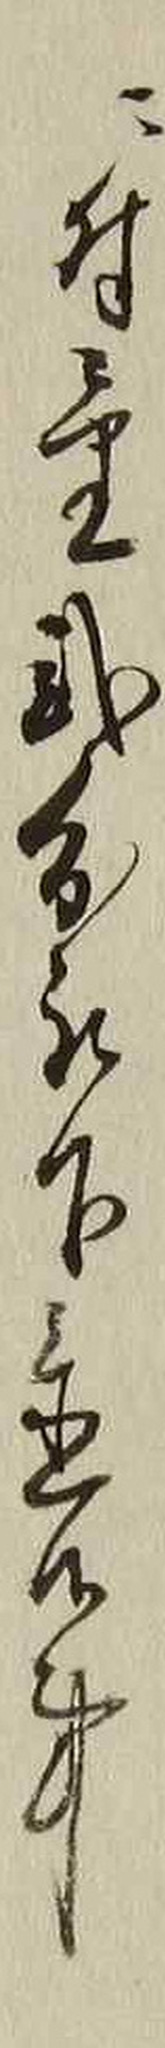ニ付金弐分被下置候事
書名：諸士系譜　巻之129　た之部5
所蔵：会津若松市立会津図書館
